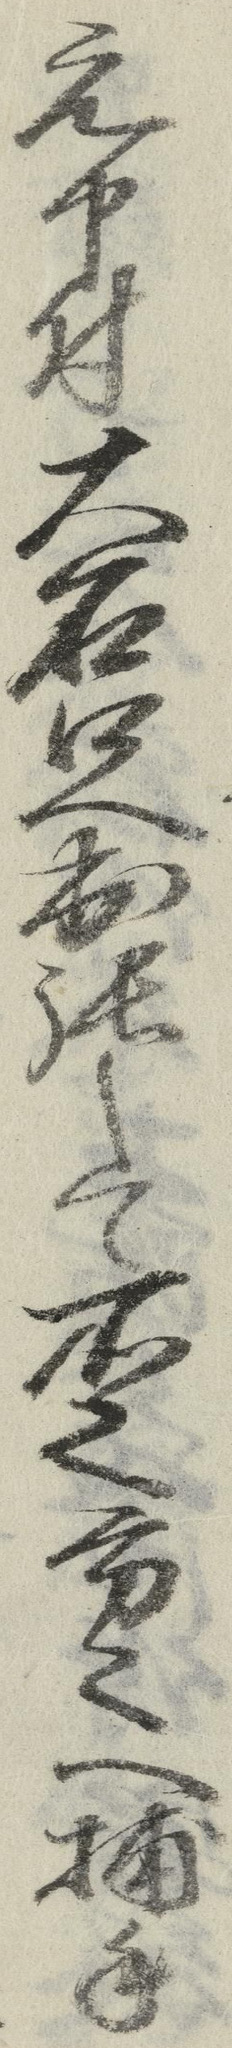え申付大石口ヘ出張して所々方々へ捕手
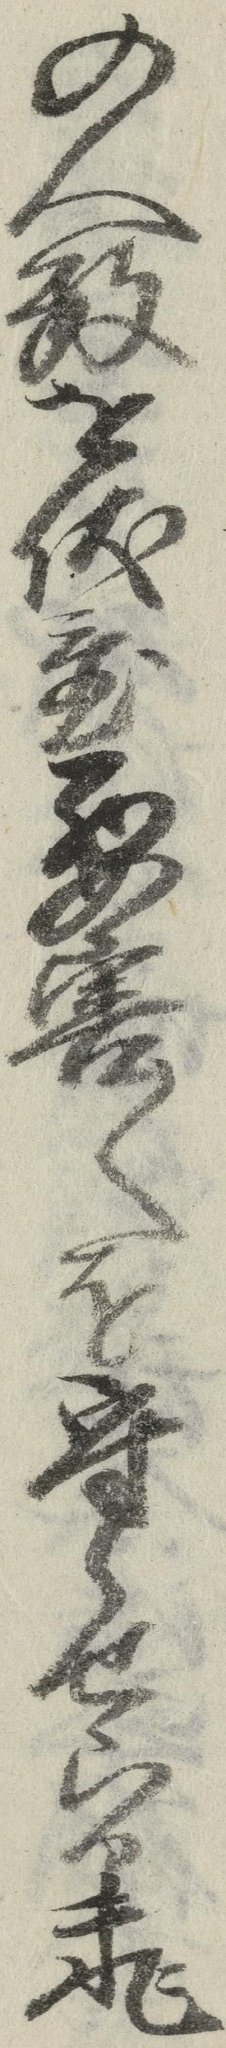の人数を伏置要害〳〵を守らせらる飛
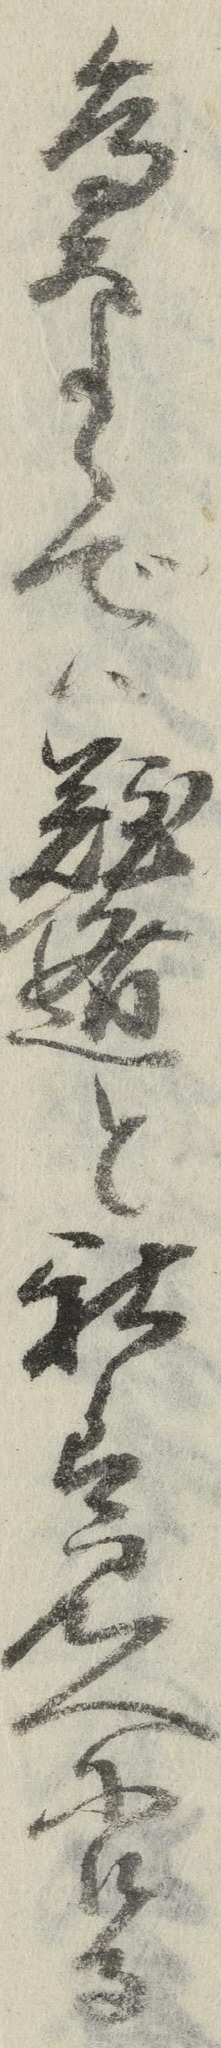鳥ならでは難遁と秋は見へにける
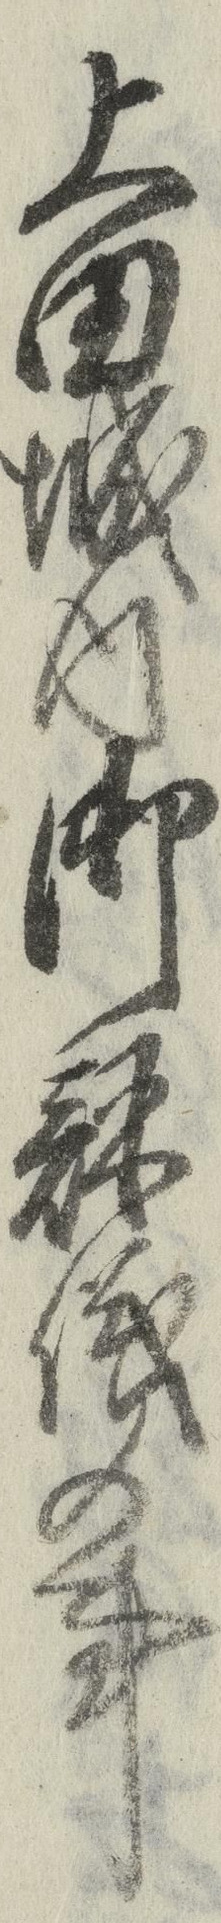上田城内御評儀の事
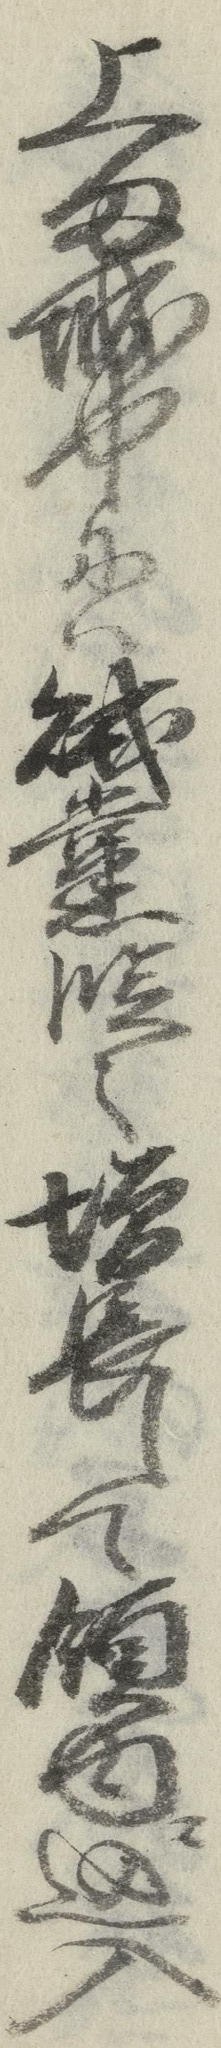上田城中には賊党段々増長して領内に込入
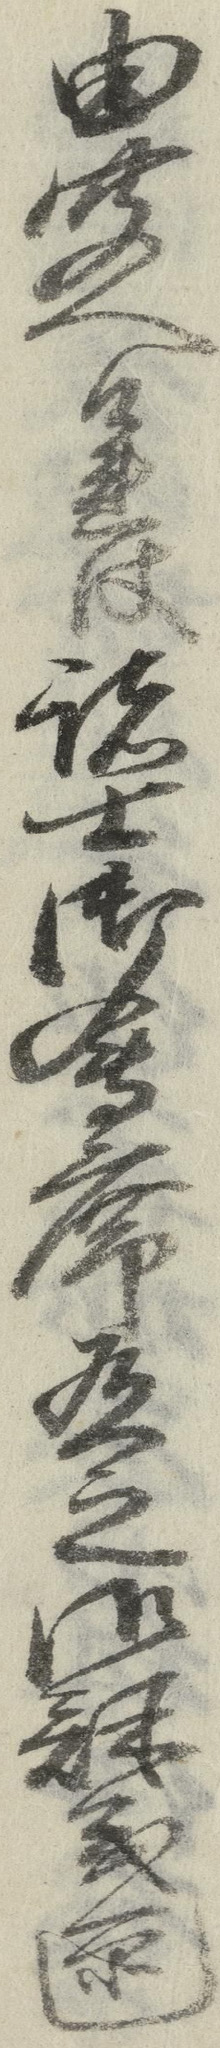由聞へけれは諸士御会席有之御評義區

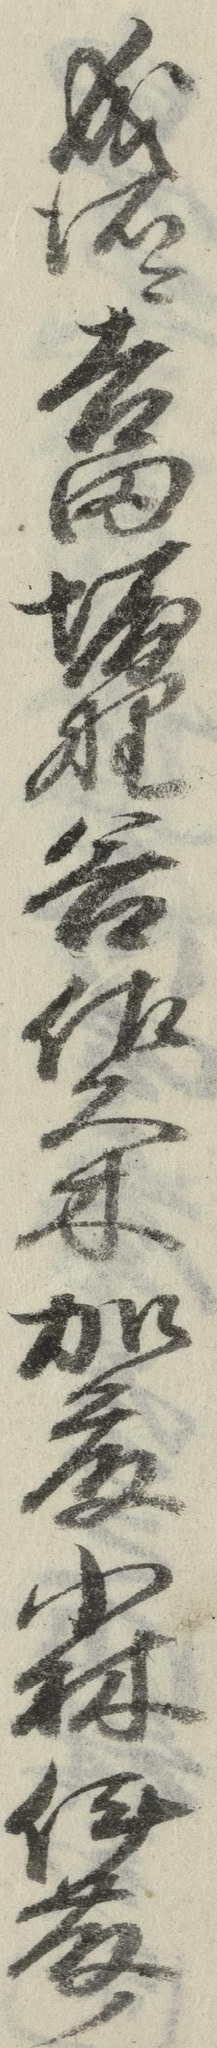成所に吉田堀野谷佐久木加藤小林伊藤ノ
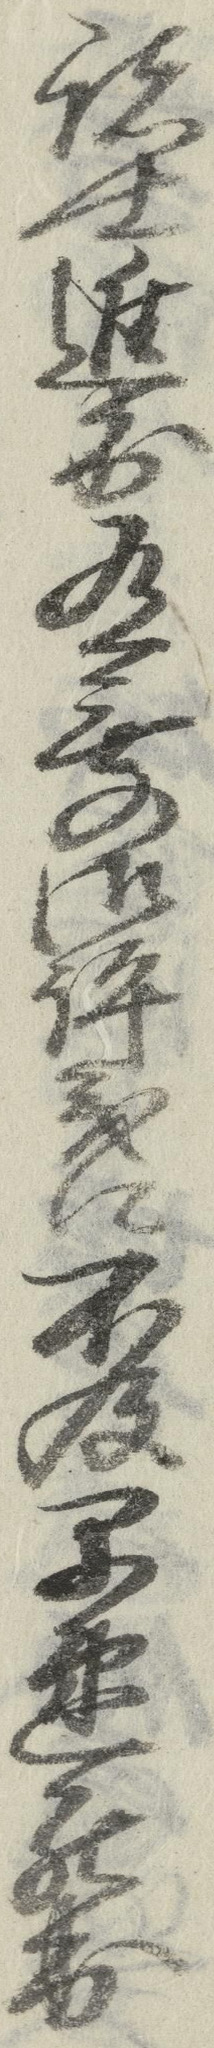諸士進出有無の御評義に不及早速罷出
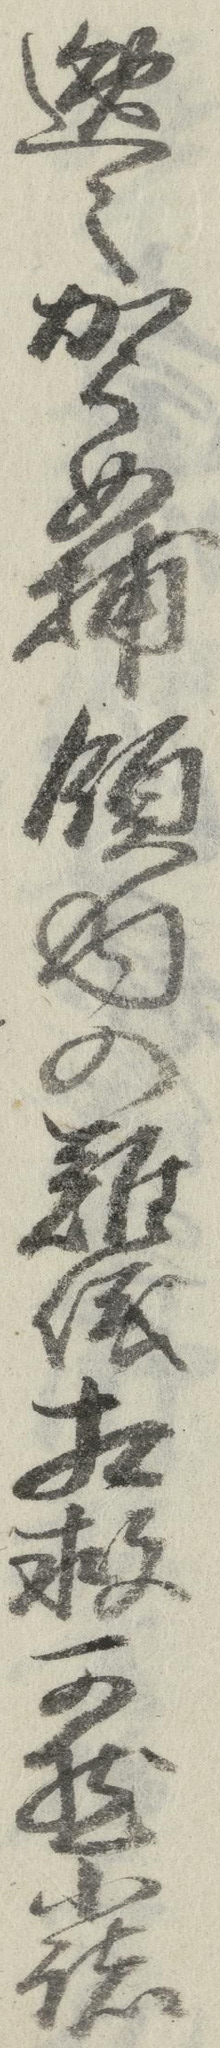逸々からめ捕領内の難儀相救可然小諸
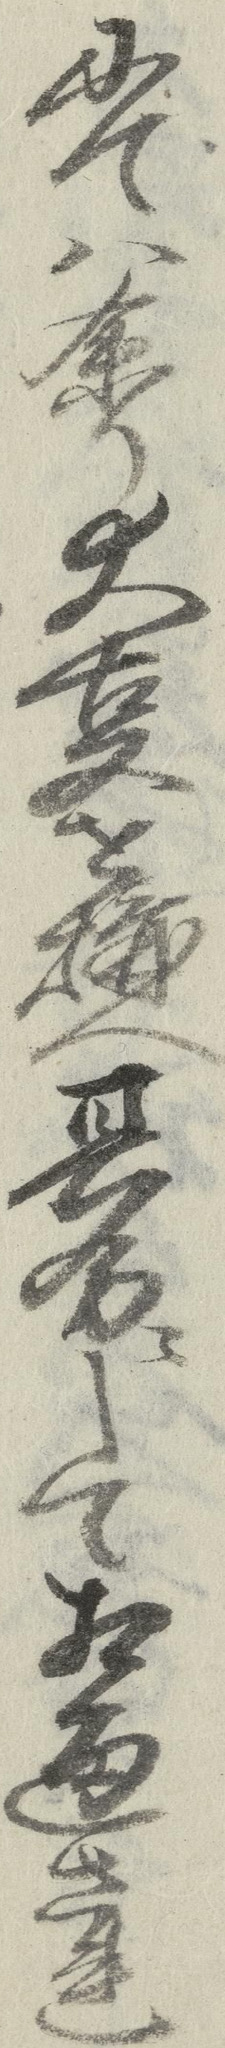にては余り大事を構へ其分にして相通され
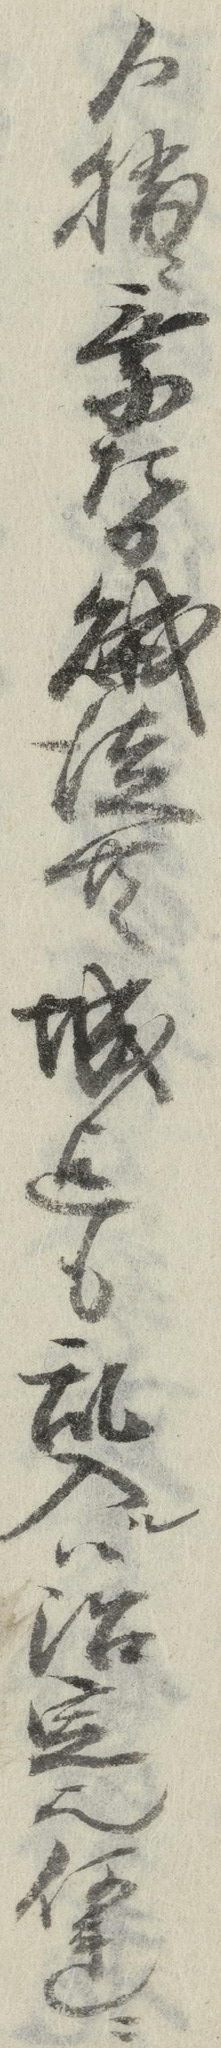候勝に乗たる賊徒共城迄も乱入治定也何れに
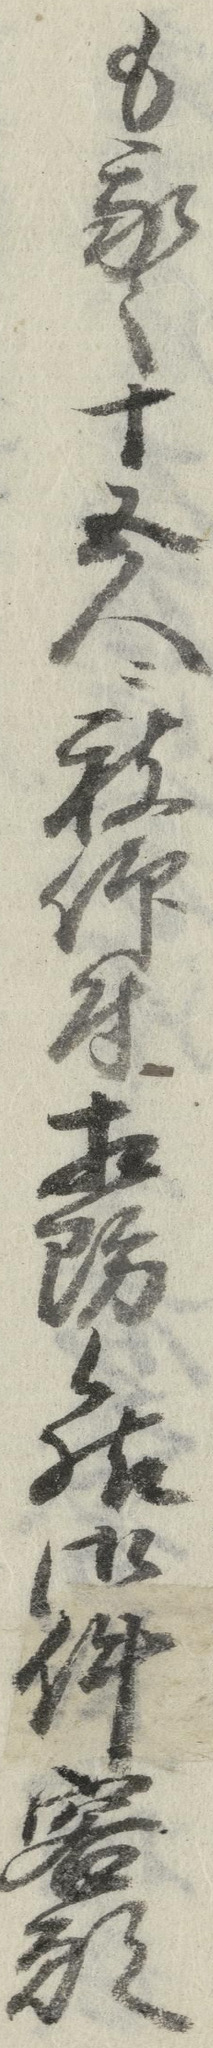も我々十五人に被仰付相防候様御件容願
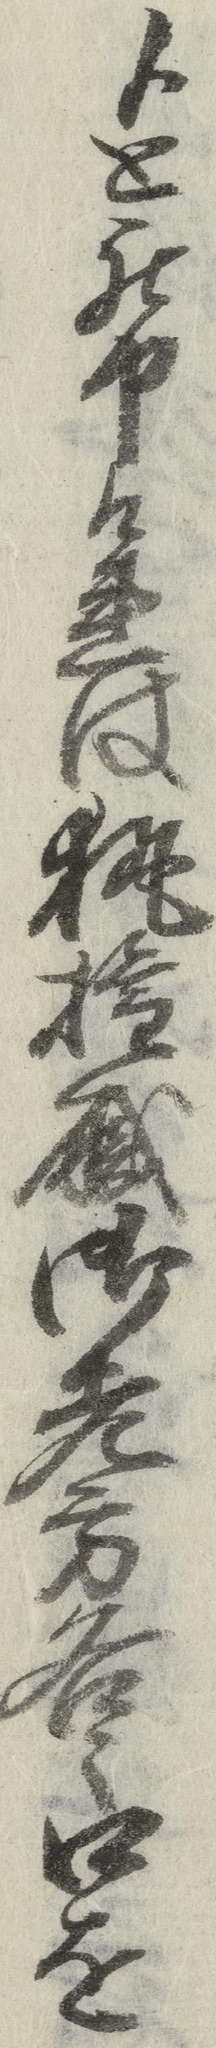候と被申けれは執権職御老方各々口を
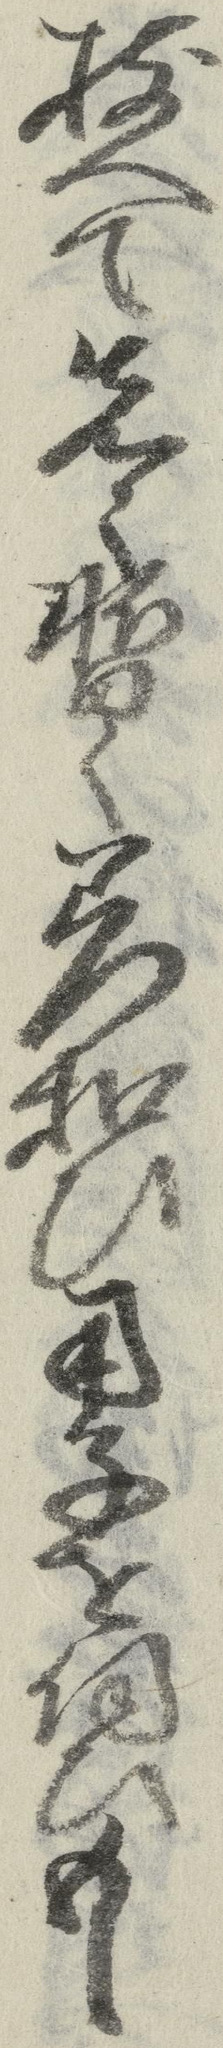揃へて先々暫く差扣ひ用子を伺ひもし
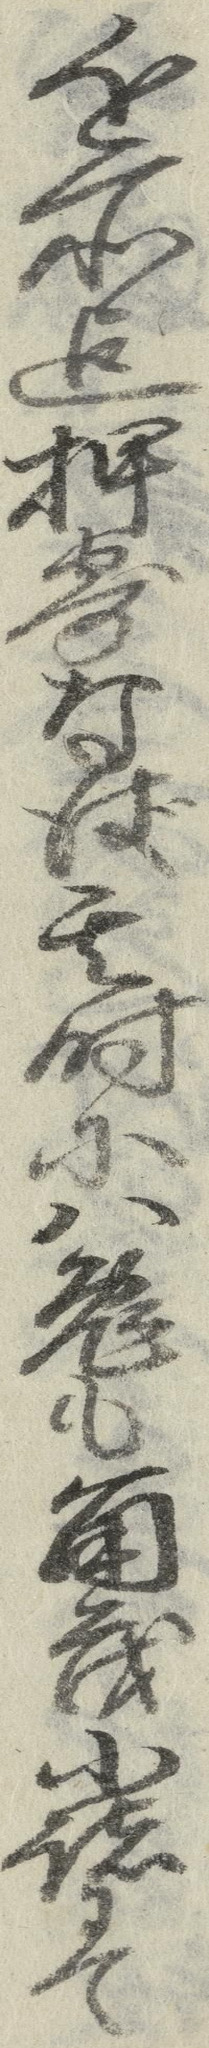近所迄押寄なば其時には兎も角も小諸にて
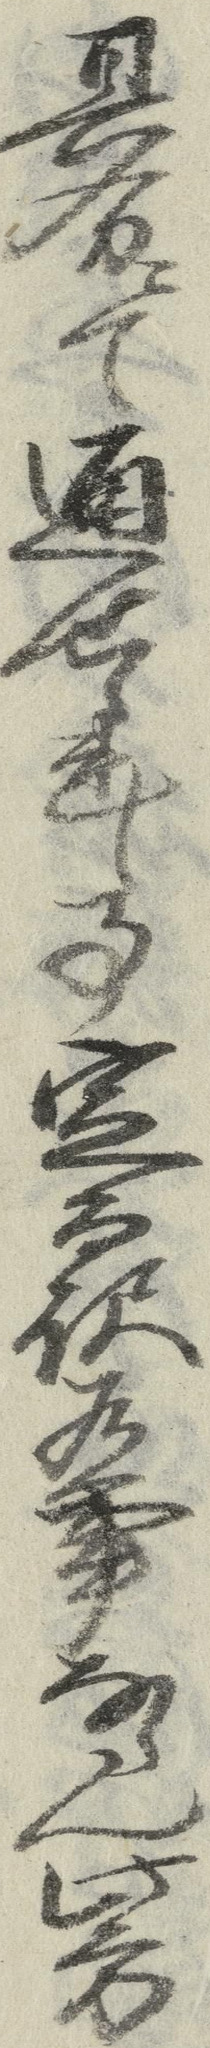其分にて通せられし事定而訳有事ならん此方
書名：浅間大焼騒動記　下
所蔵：東京大学地震研究所図書室 Earthquake Research Institute Library, The University of Tokyo, JAPAN
